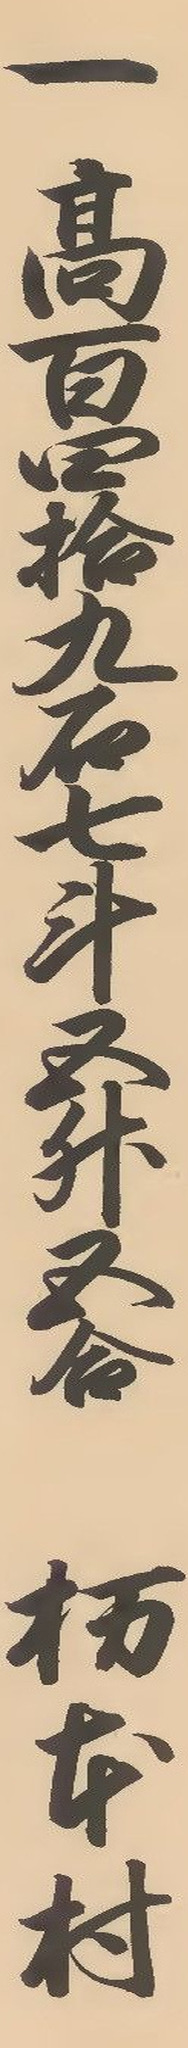一高百四拾九石七斗五升五合栃本村
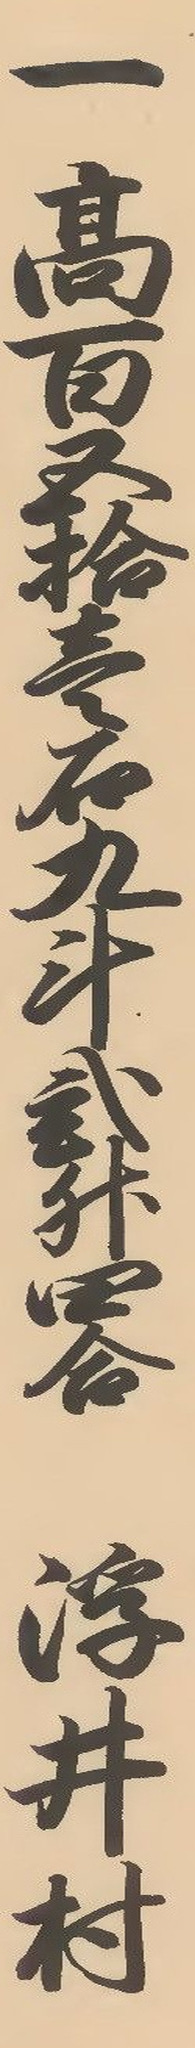一高百五拾壱石九斗弐升四合浮井村

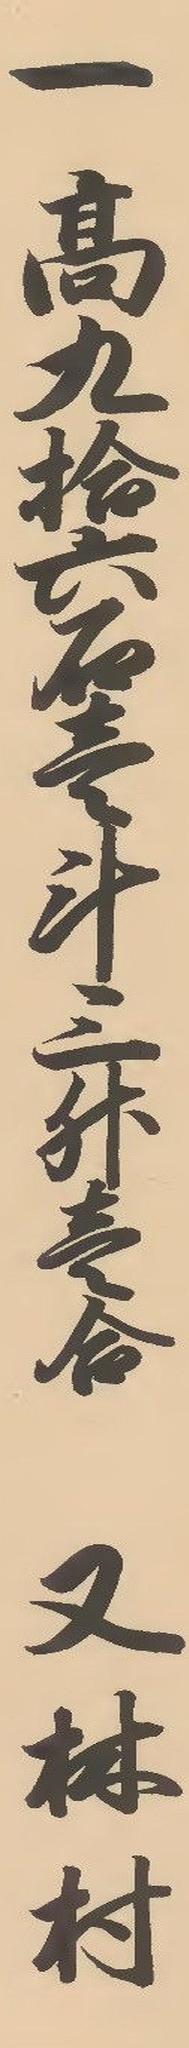一高九拾六石壱斗三升壱合又林村
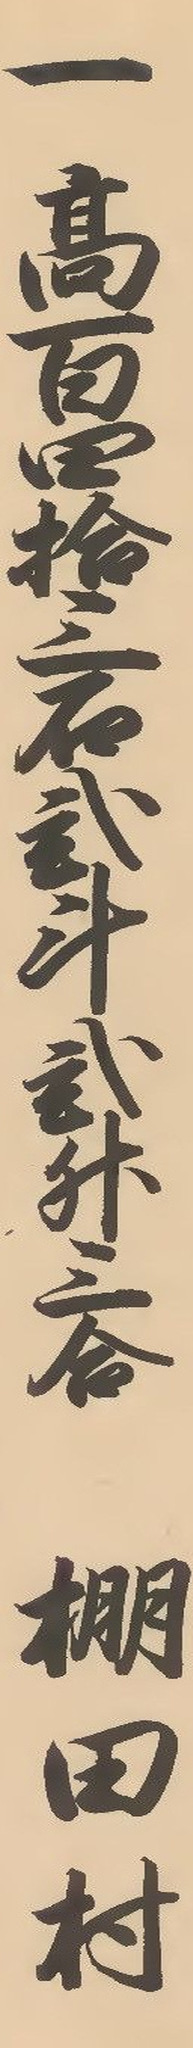一高百四拾三石弐斗弐升三合棚田村
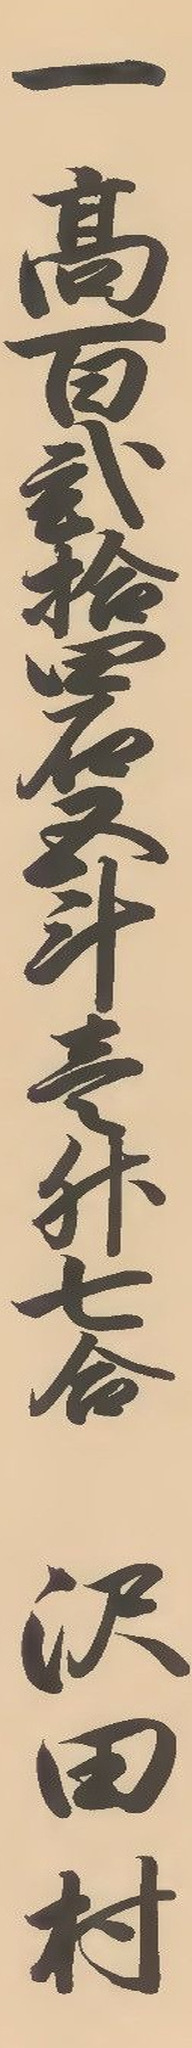一高百弐拾四石五斗壱升七合沢田村
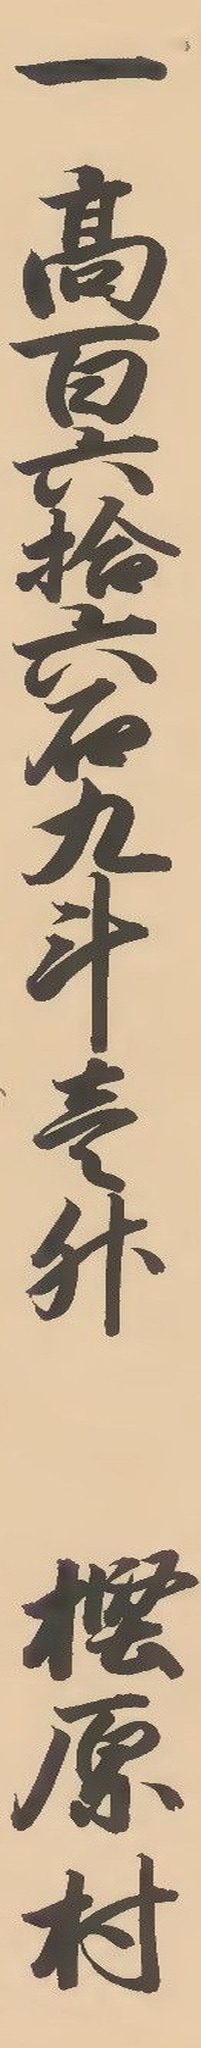一高百六拾六石九斗壱升樫原村
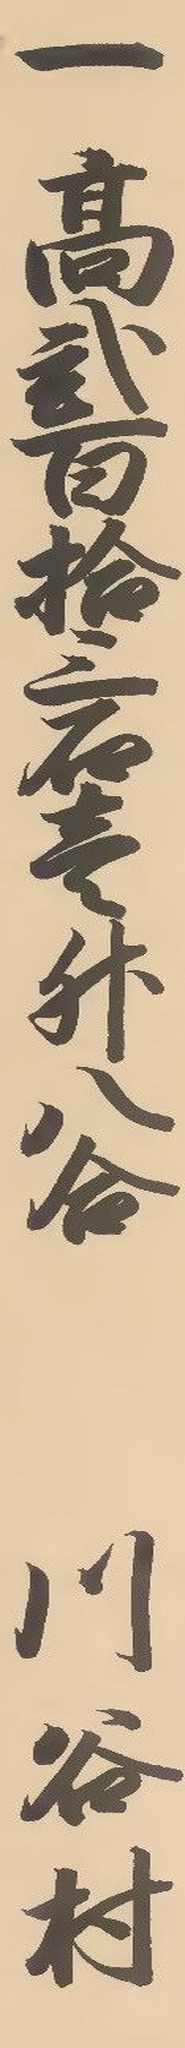一高弐百拾三石壱升八合川谷村
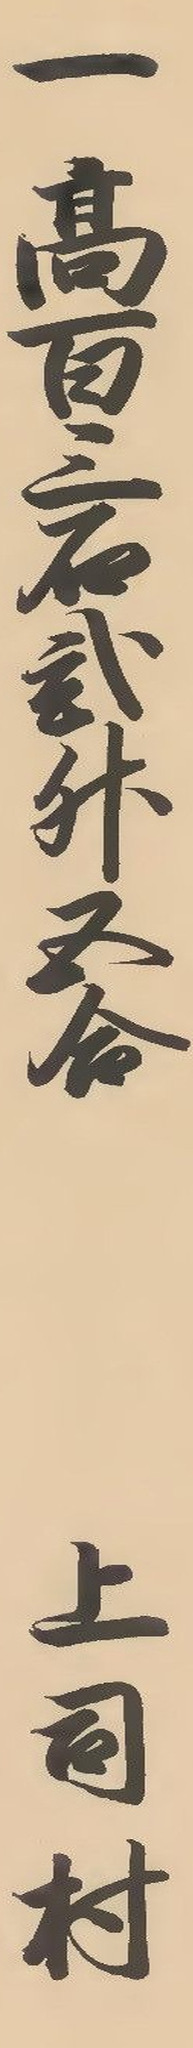一高百三石弐升五合上司村
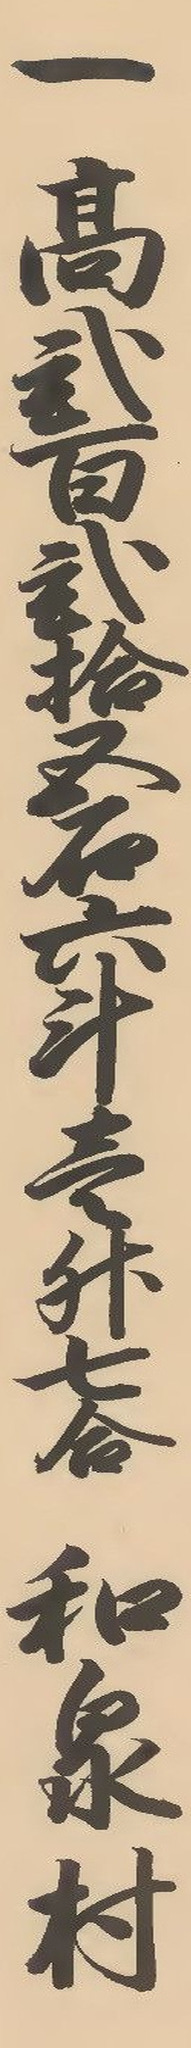一高弐百弐拾五石六斗壱升七合和泉村
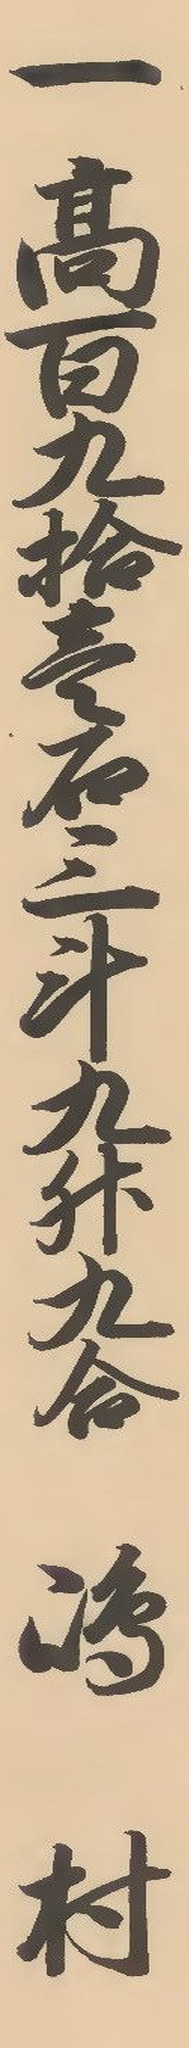一高百九拾壱石三斗九升九合島村

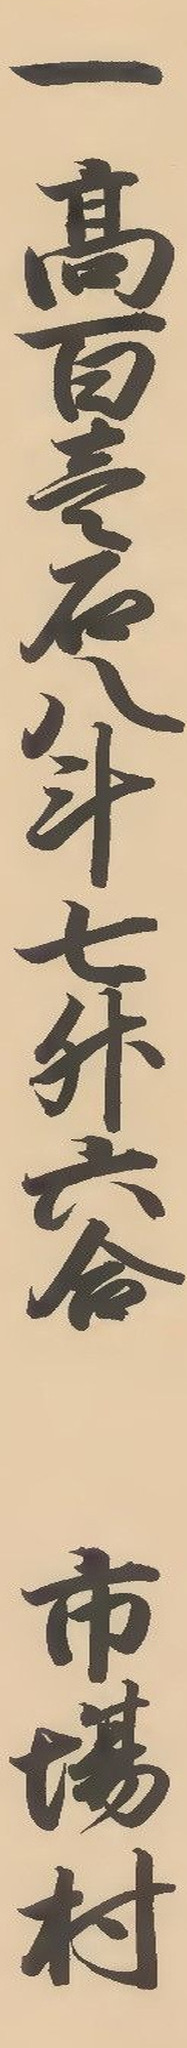一高百壱石八斗七升六合市場村
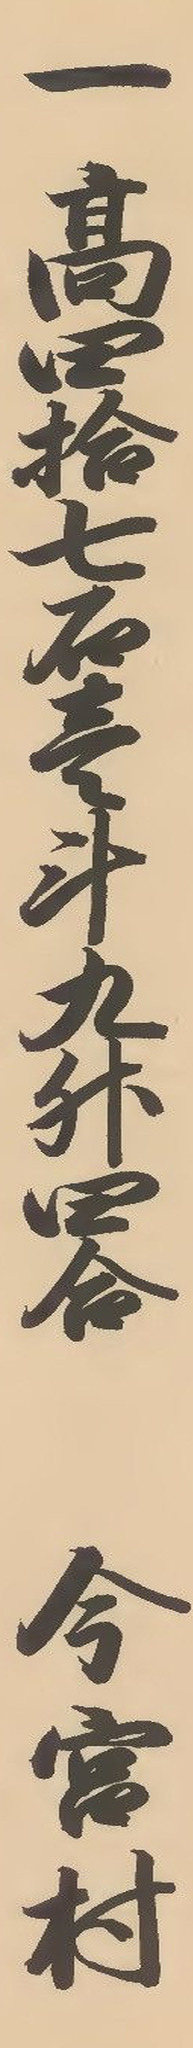一高四拾七石壱斗九升四合今宮村
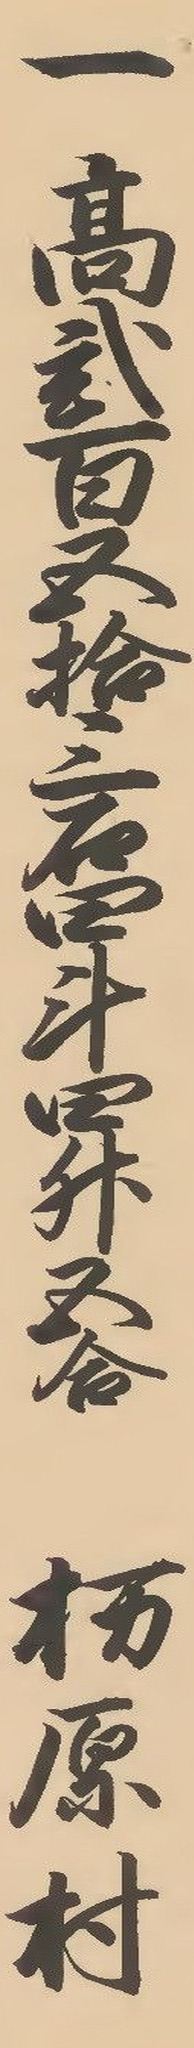一高弐百五拾三石四斗四升五合栃原村
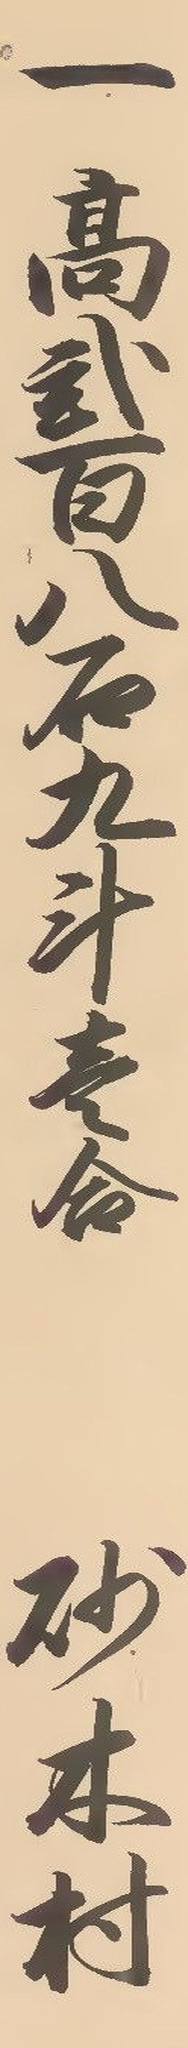一高弐百八石九斗壱合砂木村
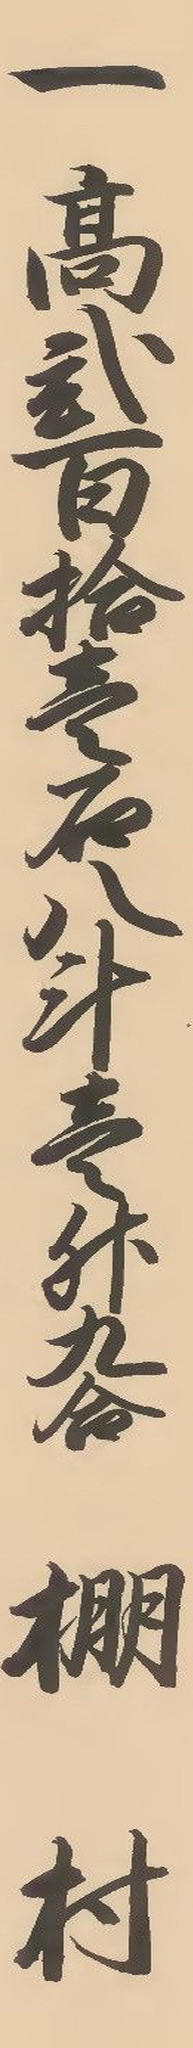一高弐百拾壱石八斗壱升九合棚村
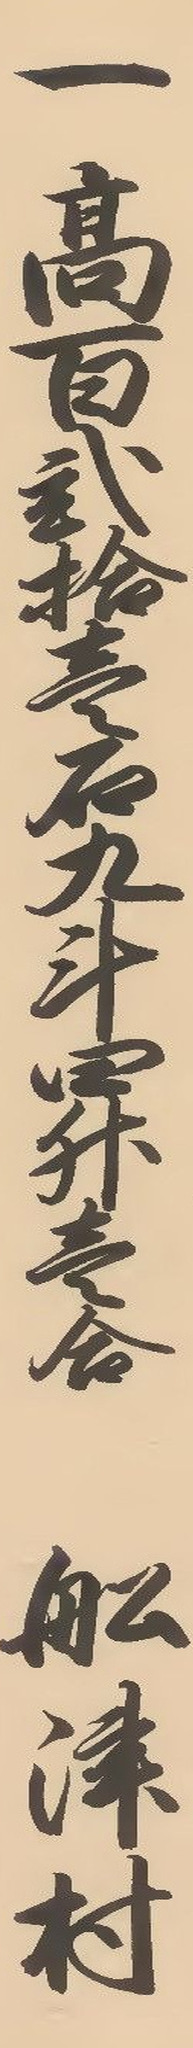一高百弐拾壱石九斗四升壱合船津村
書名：丹波国郷帳
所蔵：国立公文書館 National Archives of Japan
